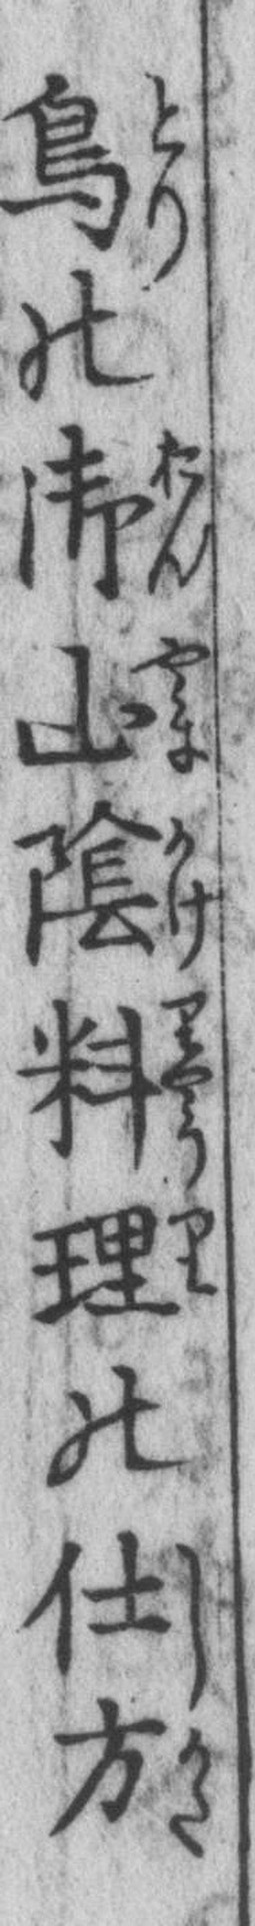鳥の御山陰料理の仕方
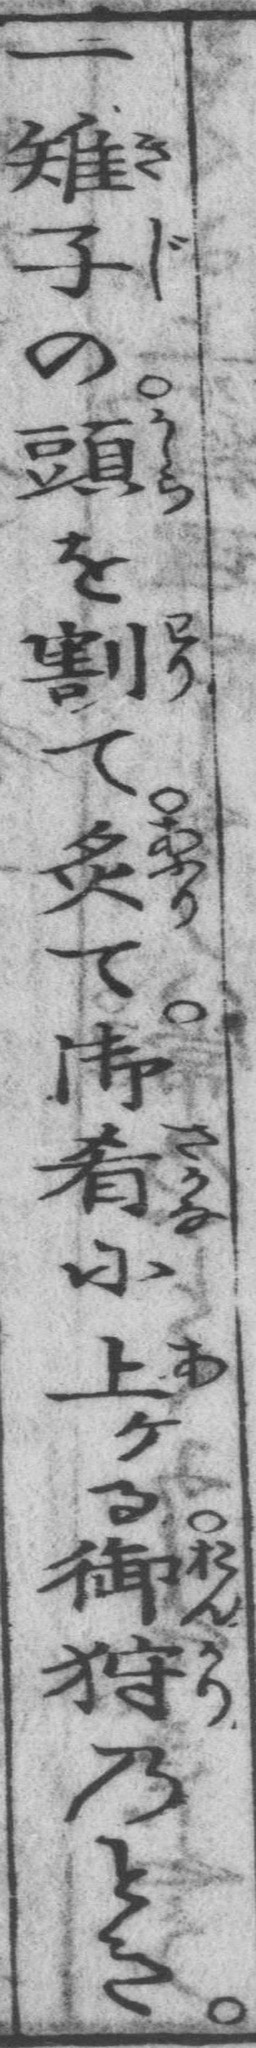一雉子の。頭を割て。炙て。御肴に上ける。御狩のとき。
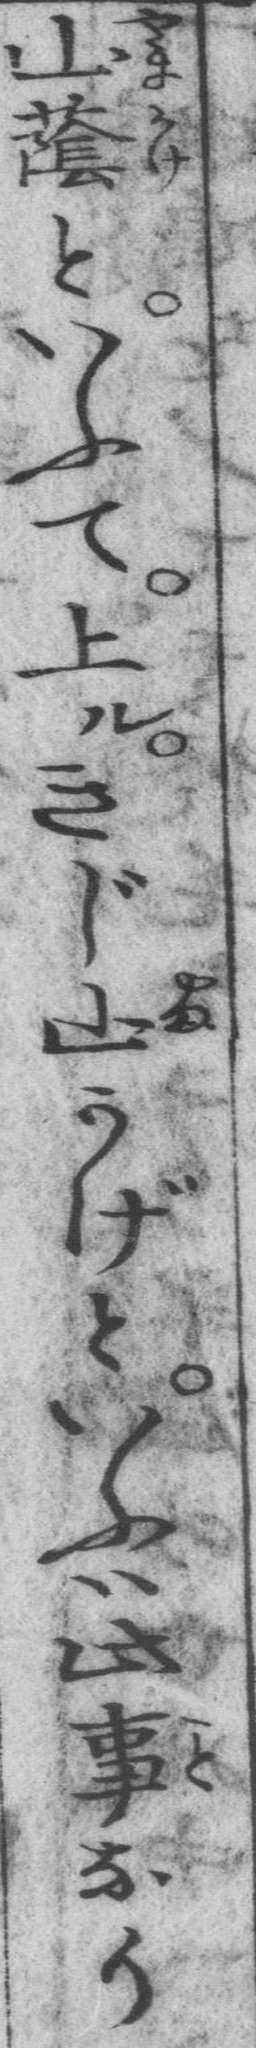山陰と。いふて。上る。きじ山かげと。いふは此事なり
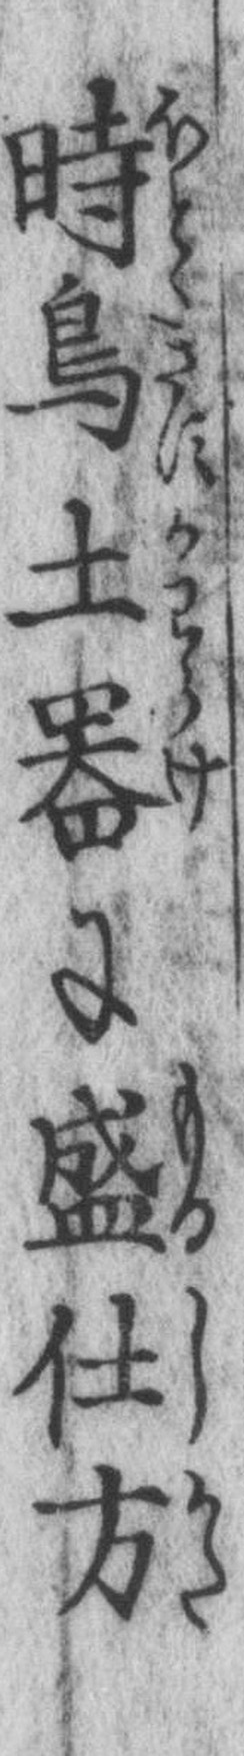時鳥土器に盛仕方
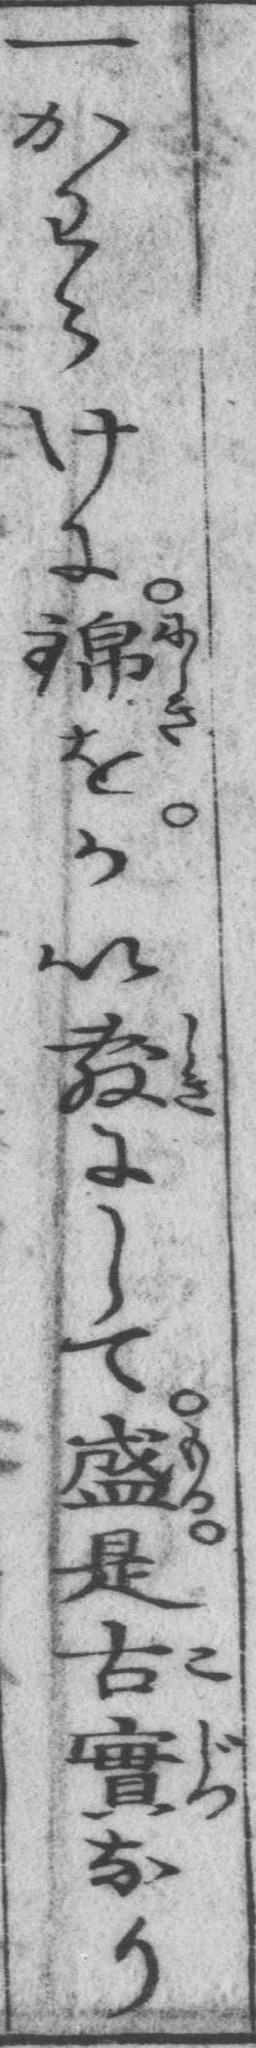一かわらけに。錦を。かい敷にして。盛。是古実なり
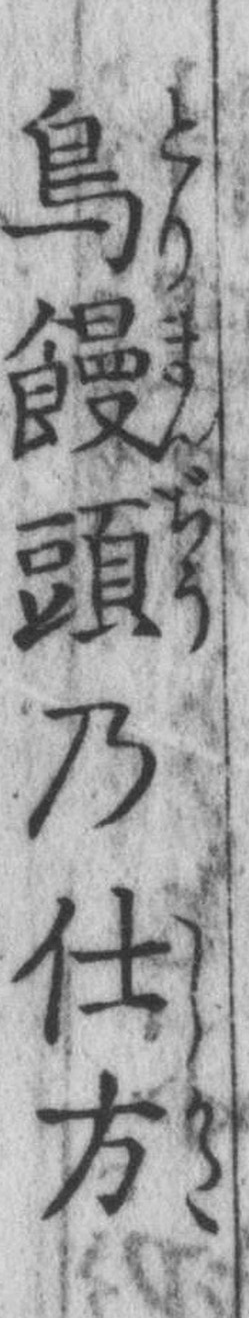鳥饅頭の仕方
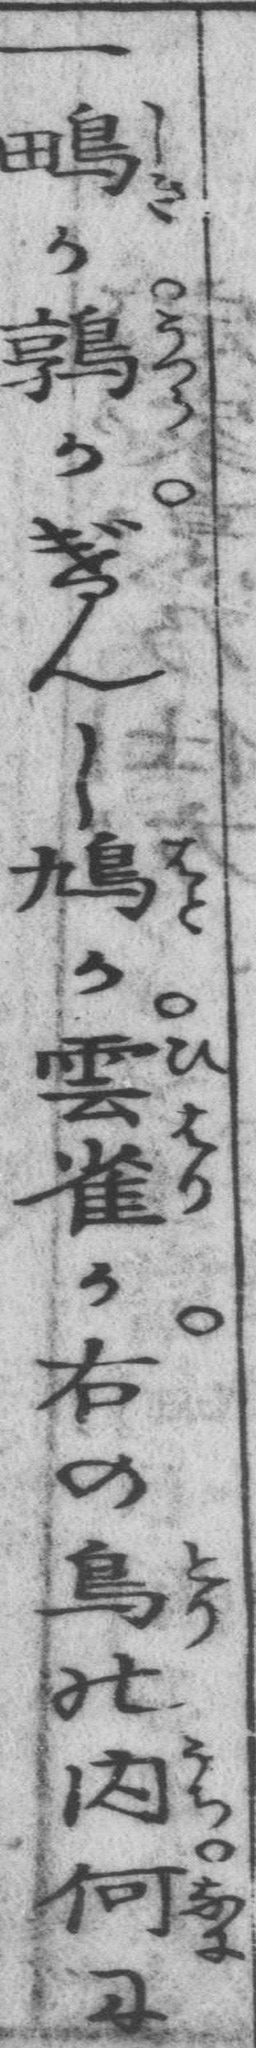一鴫か。鶉か。げんし鳩か。雲雀か。右の鳥の内。何に
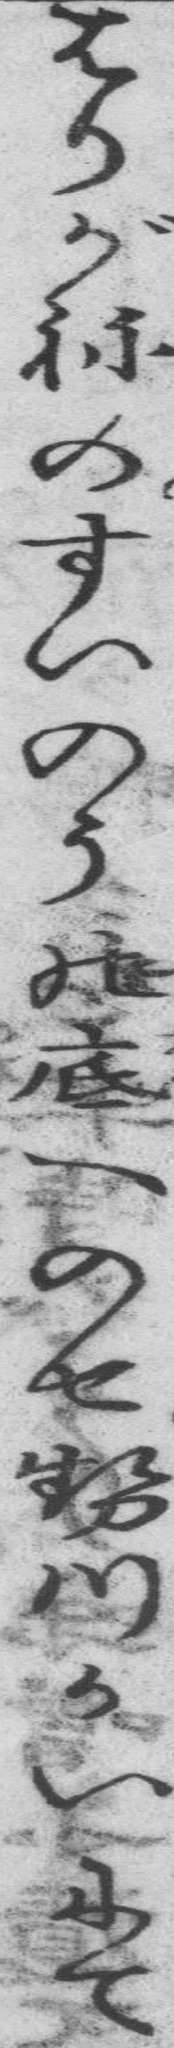はりがねの。すいのうの底へのせ。勢つかいにて。
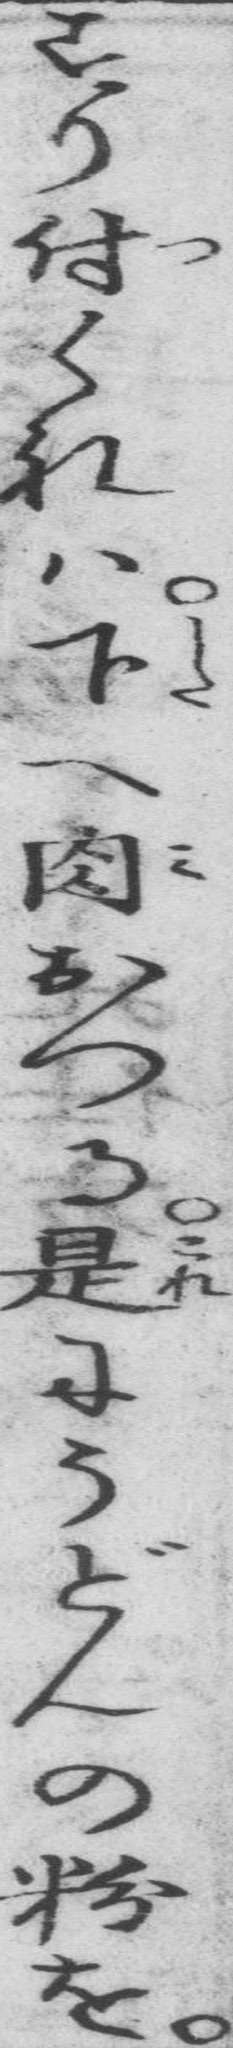すり付くれは。下へ肉おつる。是にうどんの粉を。
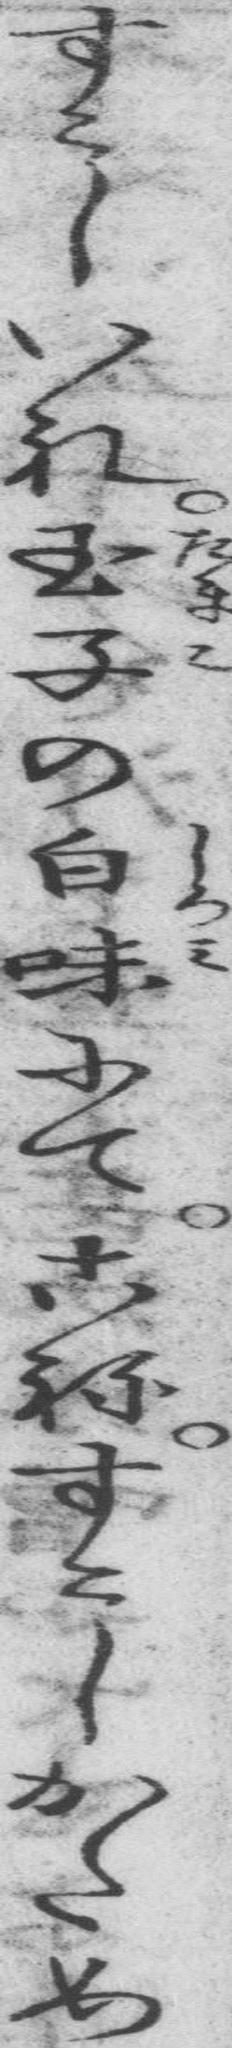すこしいれ。玉子の白味にて。こね。すこしかため
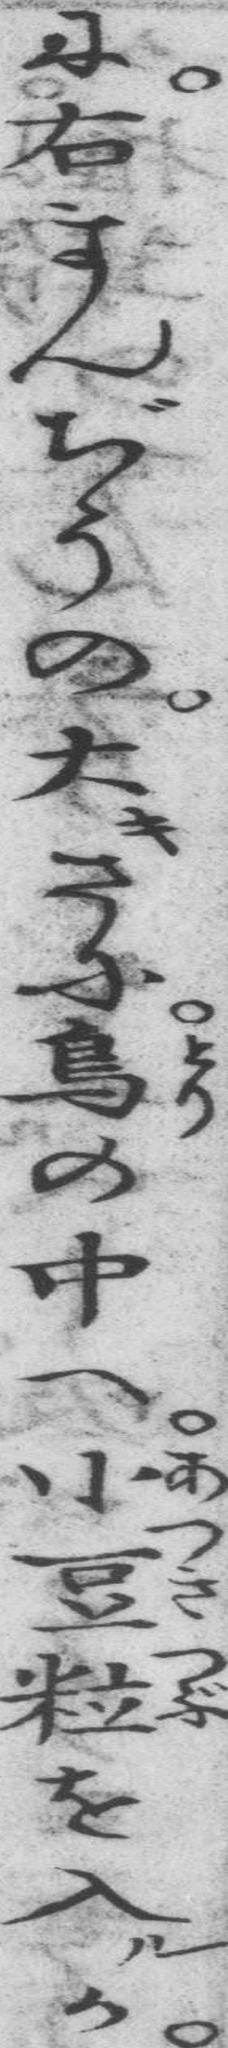に。右まんぢうの。大きさに。鳥の中へ。小豆粒を入るか。
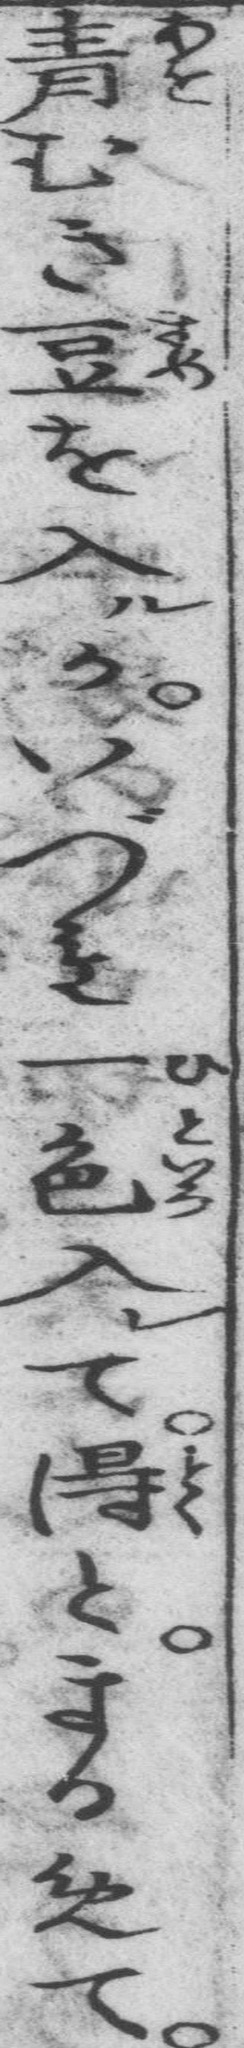青むき豆を入るか。いづれ一色入れて。得と。まるめて。
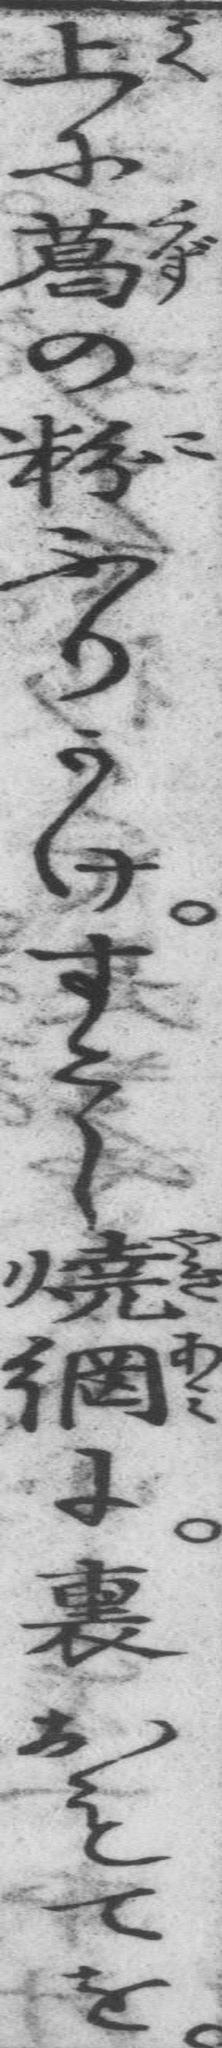上に葛の粉ふりかけ。すこし焼網に。裏おもてを。
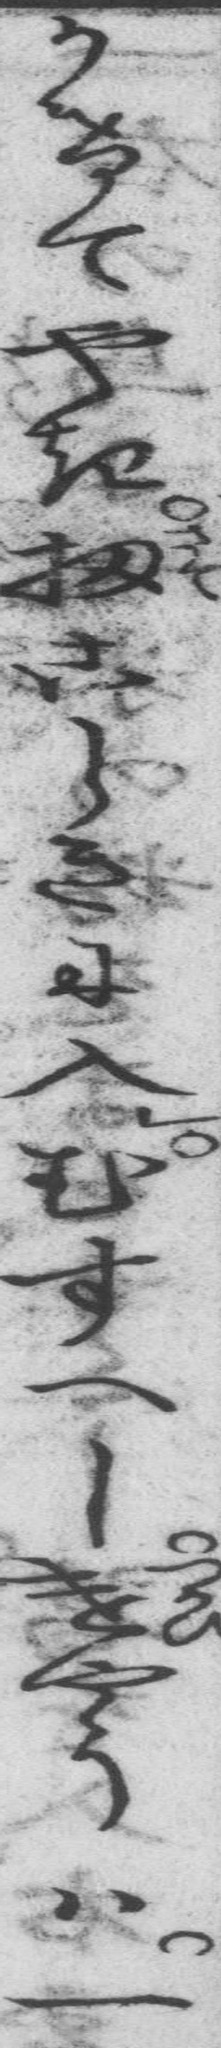かけてやき。扨こしきに入れ。むすへし。遣やうは。一
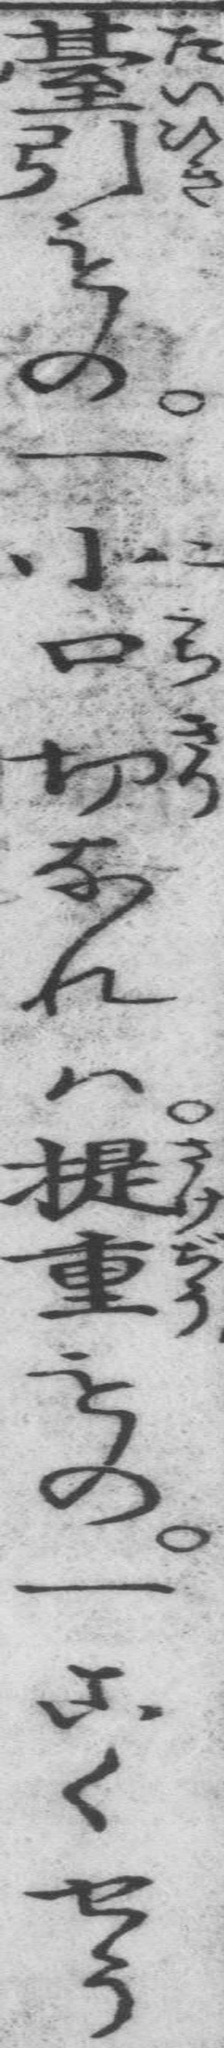台引もの。一小口切なれは。提重もの。一こくせう
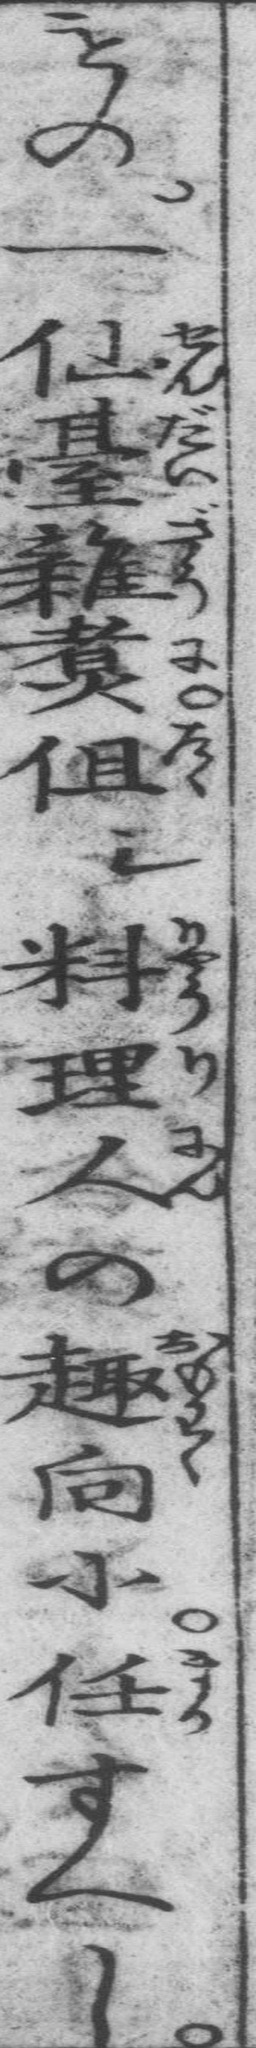もの。一仙台雑煮。但し料理人の趣向に。任すへし。
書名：萬寳料理秘密箱
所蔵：大阪府立大学学術情報センター 国文学研究資料館
